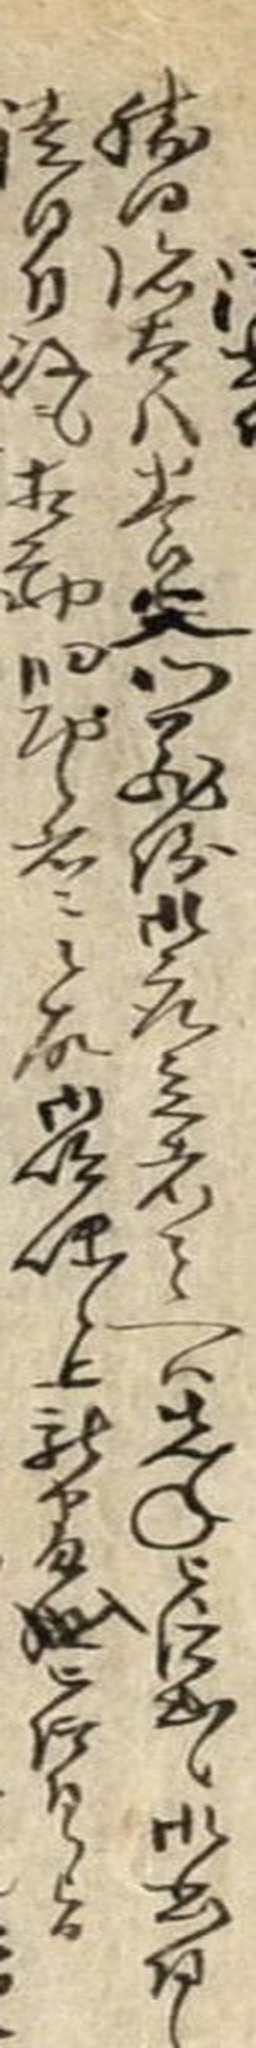徒目付役も相勤勤功之者に候故御吟味之上新番入被仰付候旨
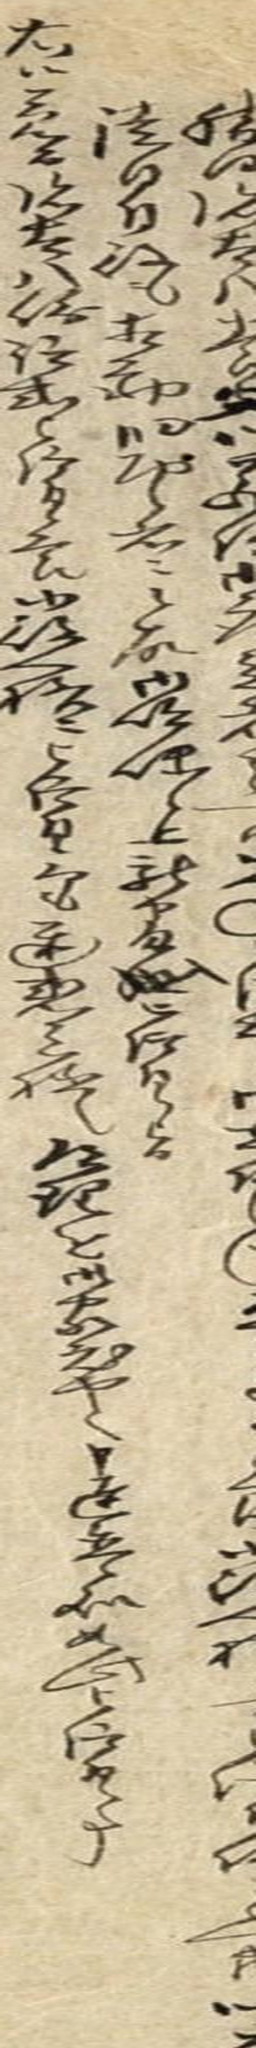右は兼而弥太八儀跡式被仰付候節小役人格に被仰付候而も迷惑至極之道理を御家老中へ申達置候処如此被仰付候事
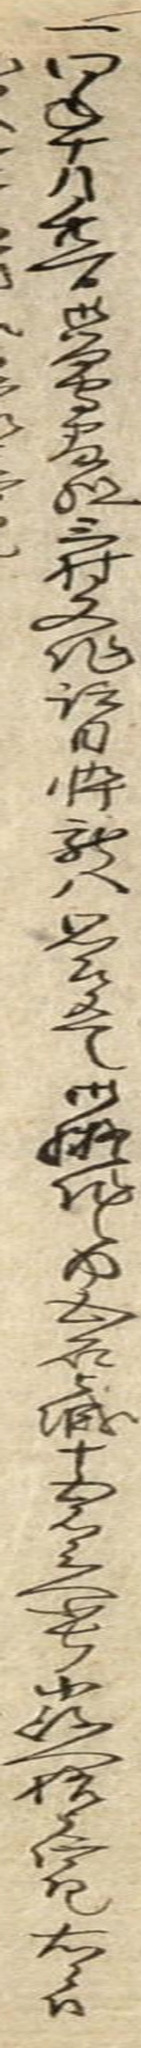一同年十月廿一日御留守番組三村又作跡目忰新八思召有之御擬作之内五石被減十五石三人ふち小役人格被仰付候右に付
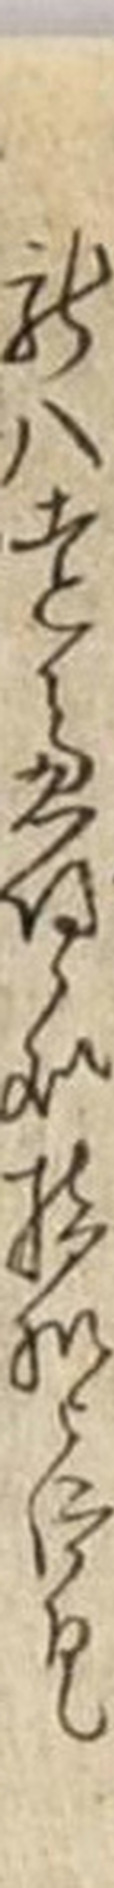新八遠慮伺候処指控被仰付候
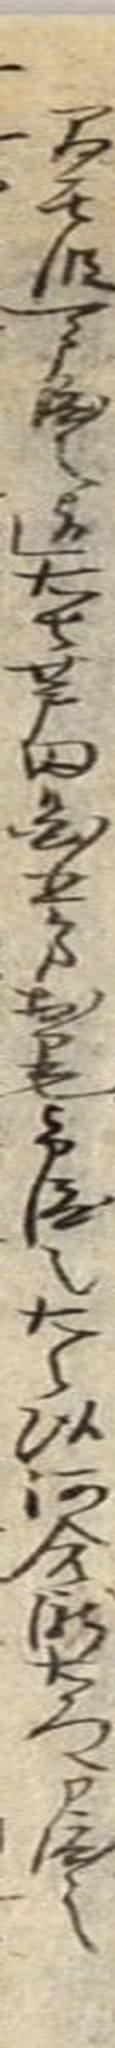間其段可申渡之旨」右は芦田図書方於宅被申渡之右之趣河合瀧右衛門へ申渡之
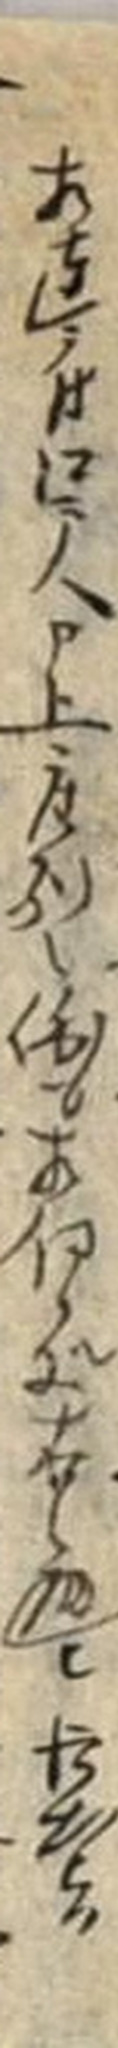相達に付江戸へ申上座列之儀も相伺候処右之通被仰出旨

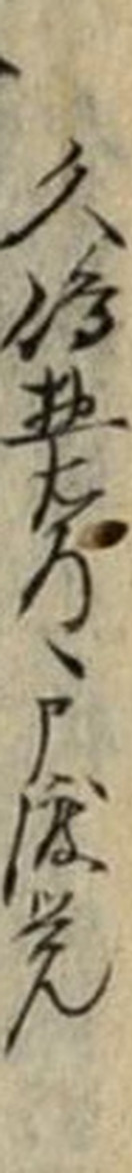久嶋惣右衛門へ申渡覚
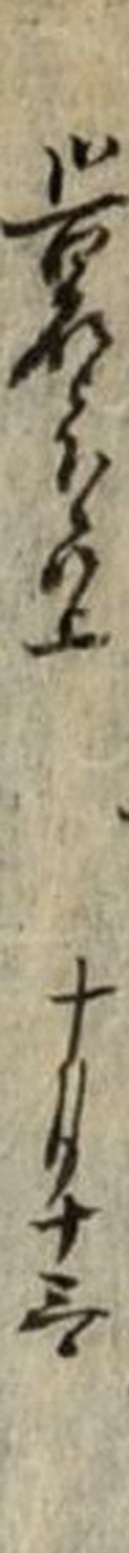弐百石被下候以上十月十三日
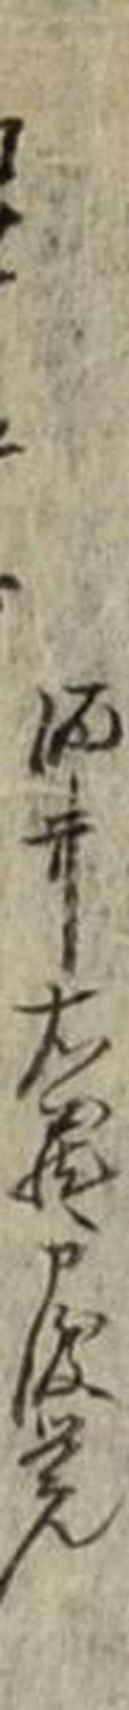酒井右蔵へ申渡覚
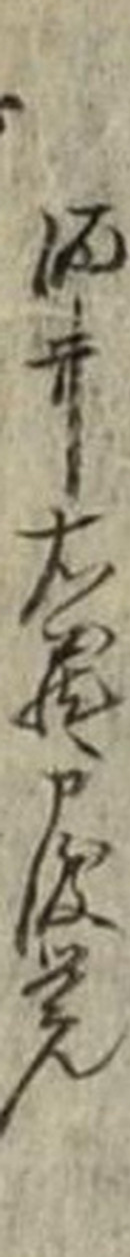酒井右蔵へ申渡覚

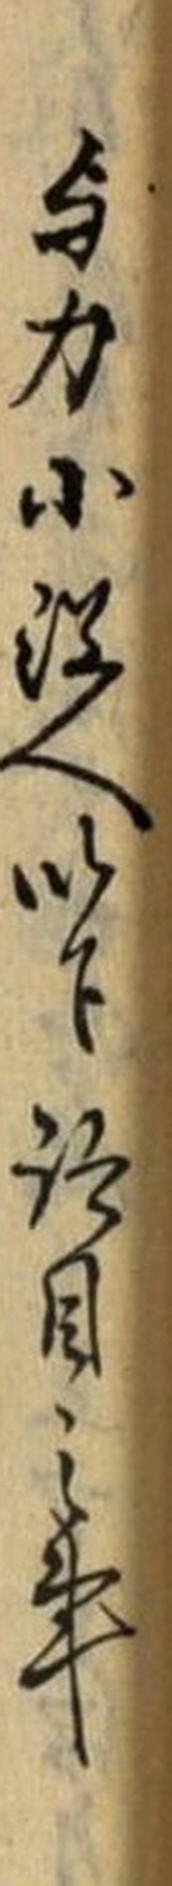与力小役人以下跡目之事
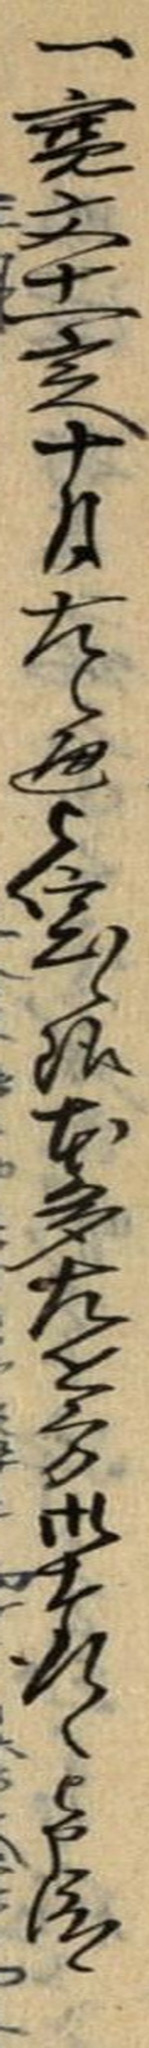一寛文十一亥十月左之通被仰出候趣本多左近方御奉行へ被申渡候
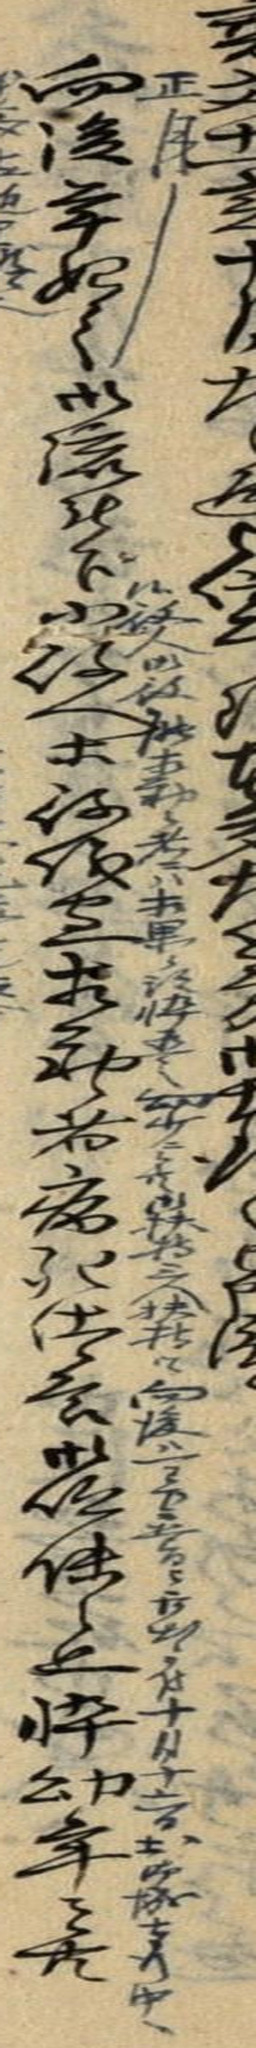向後正月年始之御流被下小役人等役儀宜相勤候者病死仕候節御吟味之上忰幼年に候共
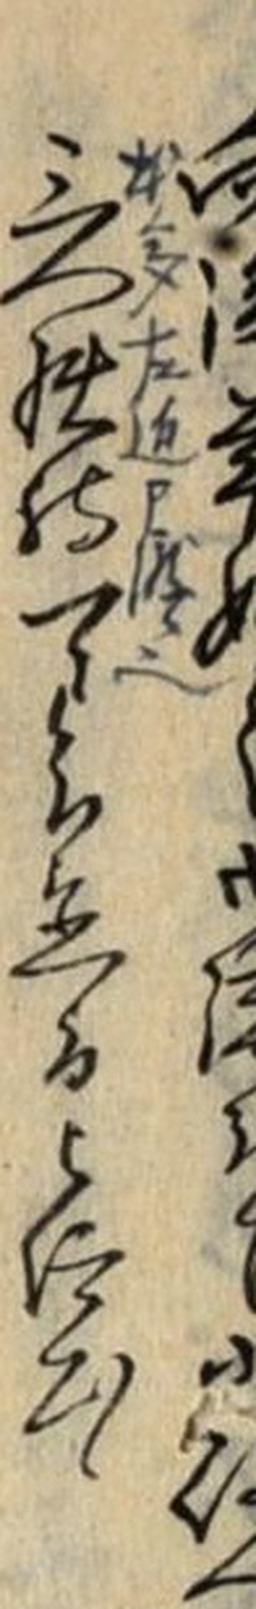三人扶持可被下置旨被仰出候
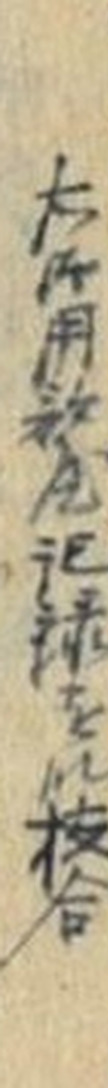右御用部屋記録を以校合
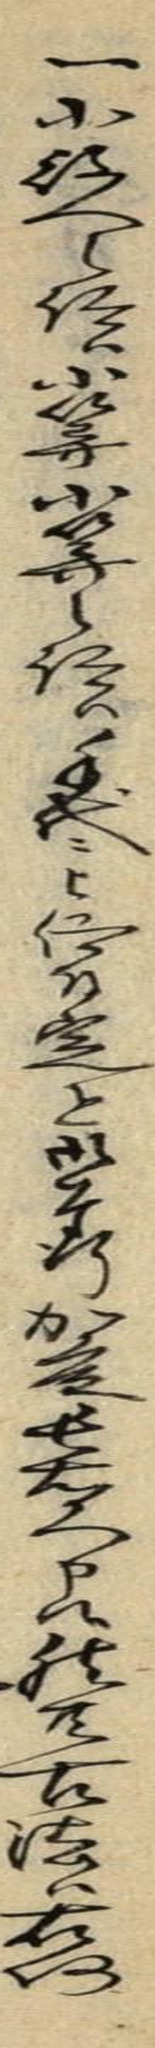一小役人之跡は小算小算之跡は手代に被仰付定と御奉行加藤長右衛門申候然共古法は右何
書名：御用并被仰出之部
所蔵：福井県文書館 Fukui Prefectural Archives
